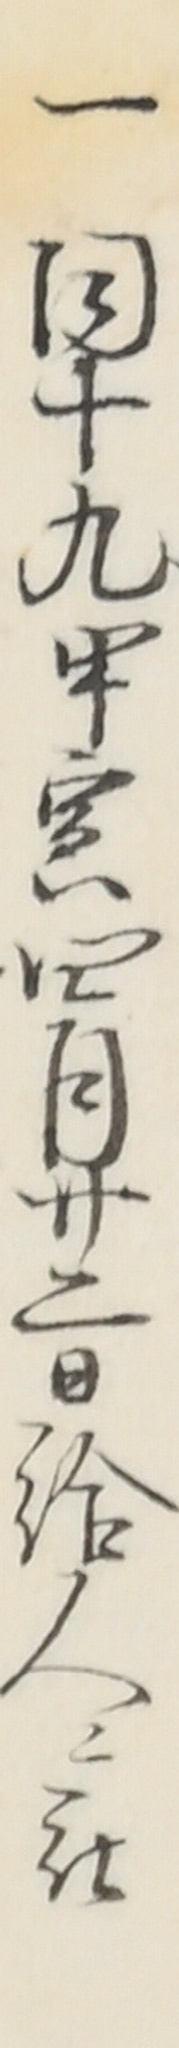一同十九甲寅四月廿二日給人ニ被
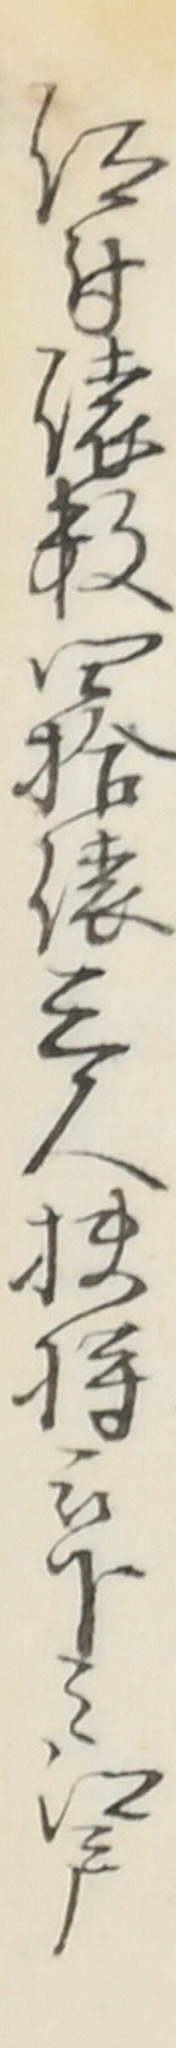仰付俵数四拾俵三人扶持被下之江戸
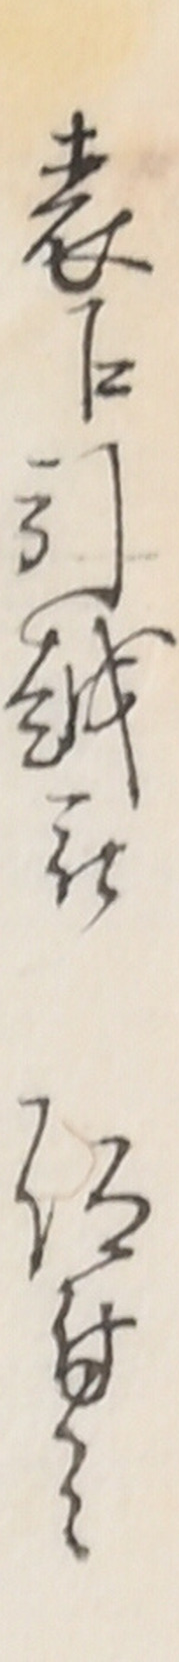表江引越被仰付之
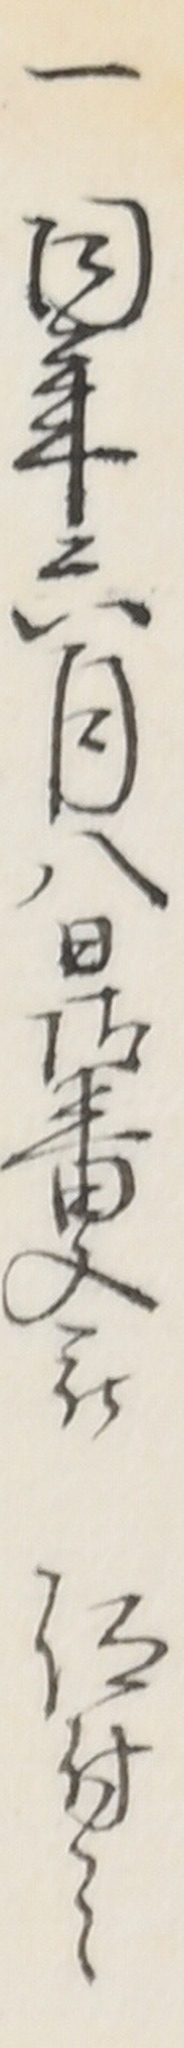一同年六月八日御番入被仰付之
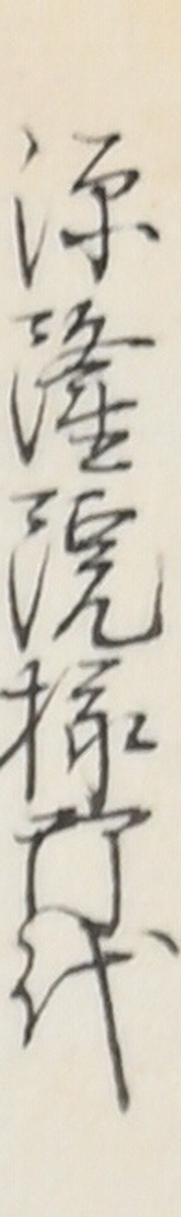源隆院様御代
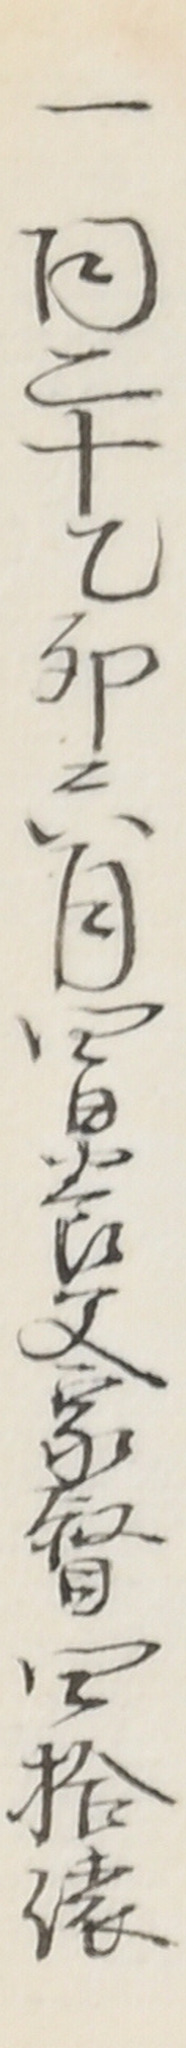一同二十乙卯六月四日養父家督四拾俵
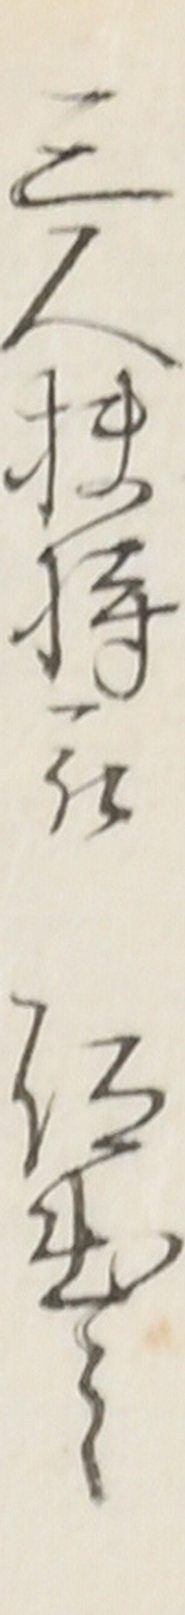三人扶持被仰出之
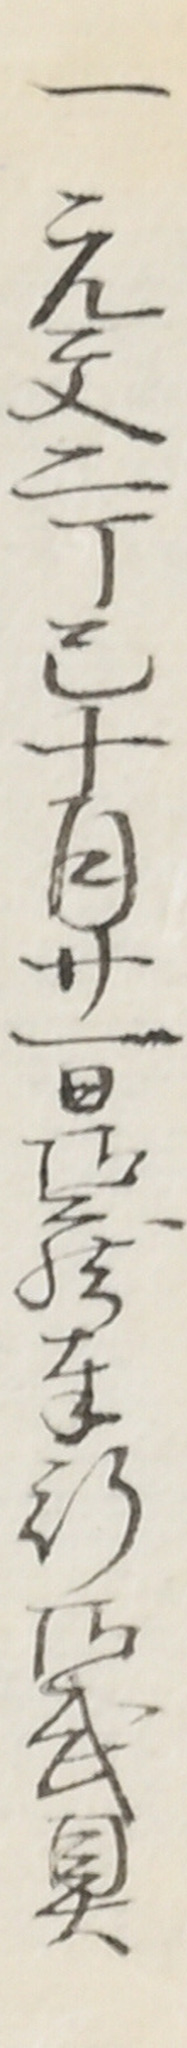一元文二丁巳十月廿一日御蔵奉行御武具
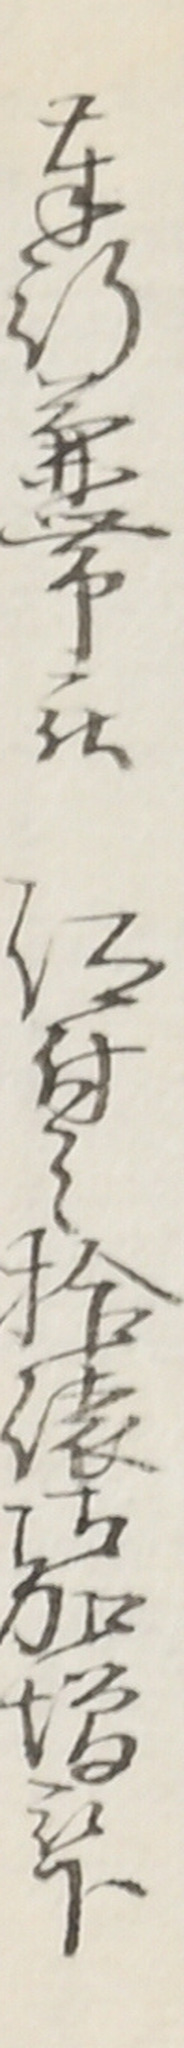奉行兼帯被仰付之拾俵御加増被下
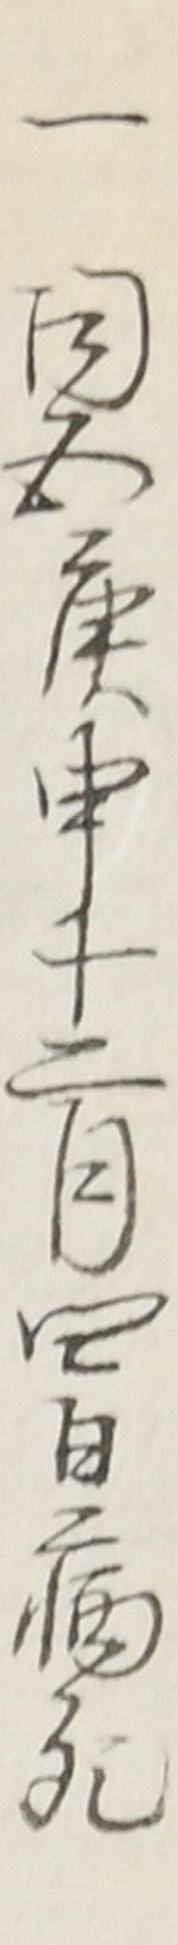一同五庚申十二月四日病死
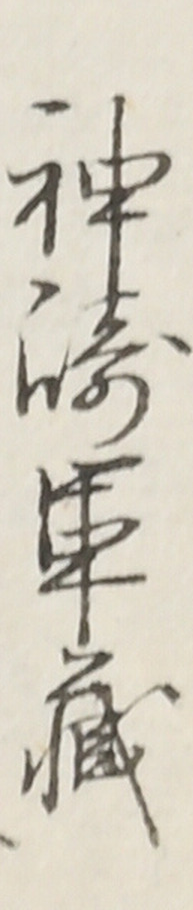神崎軍蔵
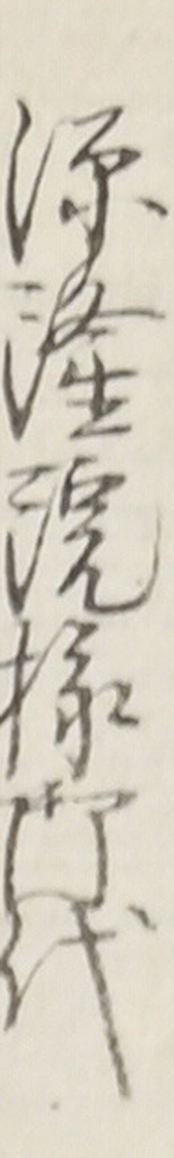源隆院様御代
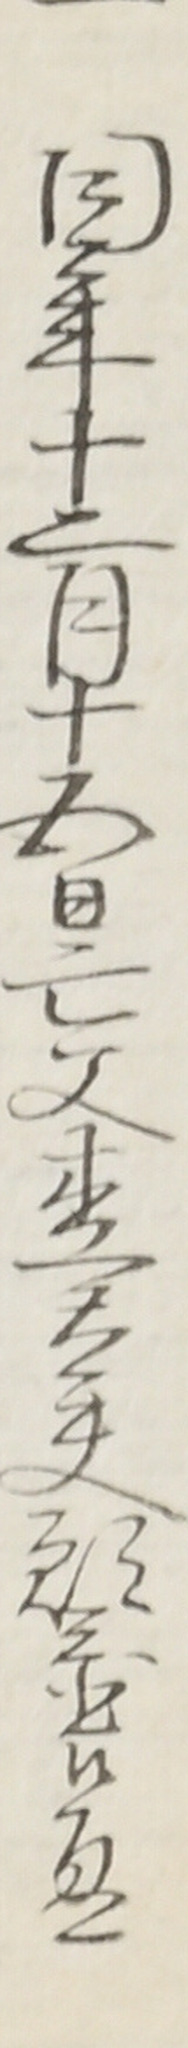一同年十二月十五日亡父杢太夫願置候通
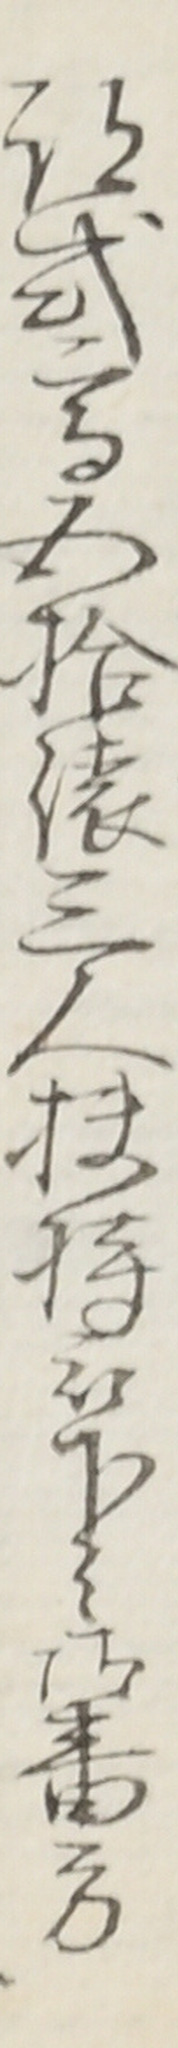跡式高五拾俵三人扶持被下之御番方
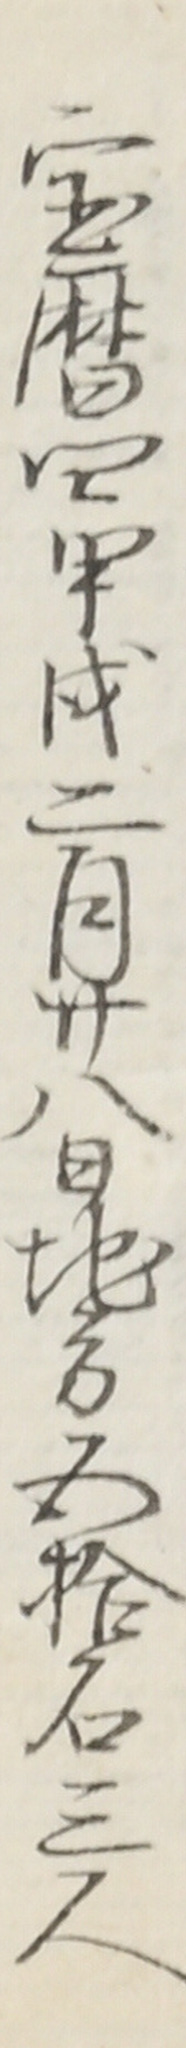一宝暦四甲戌二月廿八日地方五拾石三人
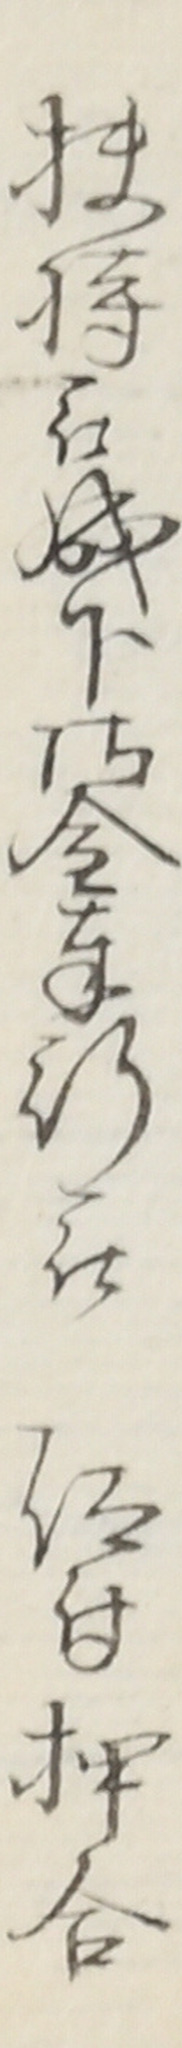扶持被成下御金奉行被仰付押合
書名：給人諸士勤仕録（七）
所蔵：伊那市立高遠町図書館・合同会社AMANE
